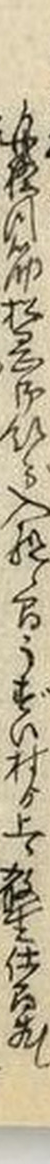舟橋川筋松岡御領分入組候間うずい村ゟ上へ殺生仕間敷候
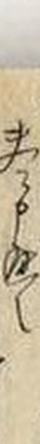夫々申通之
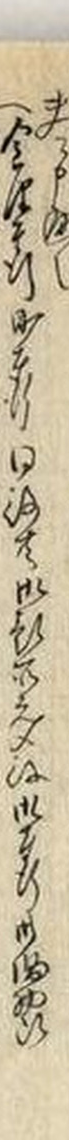金津奉行町奉行同役共御預所元〆役御奉行御側物頭
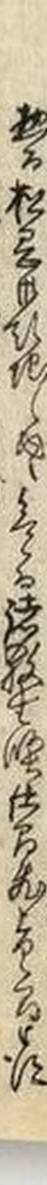惣而松岡御料地之内へ参り候而諸殺生堅仕間敷旨候間被得
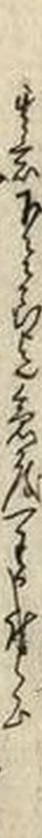其意下々ニ至迄急度可被申付候以上
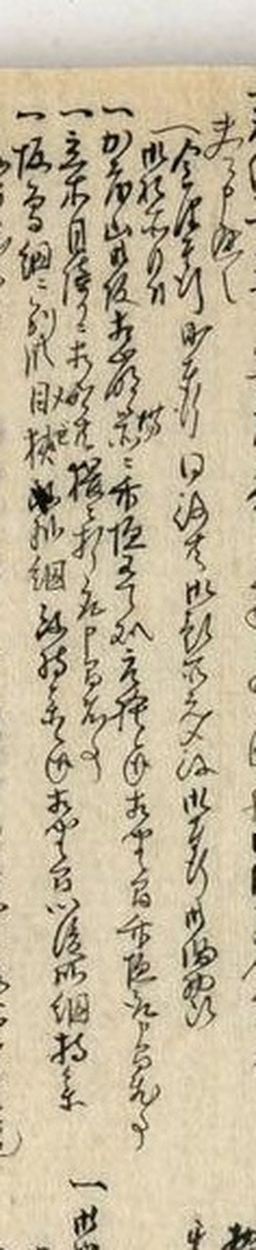一加茂山御坂相崩候場所ニ竹垣有之処取捨候趣相聞候間竹垣取申間敷事
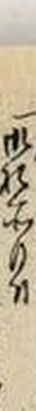御札所目付
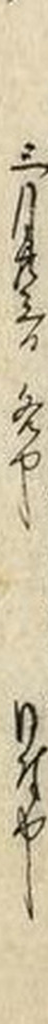三月廿三日各中目付中
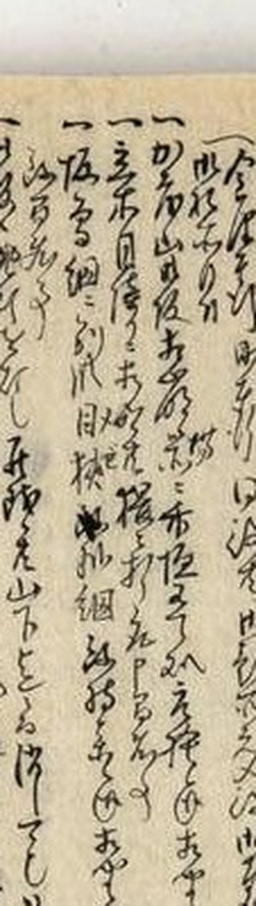一立木目障りニ相成り候共猥ニ折取申間敷事
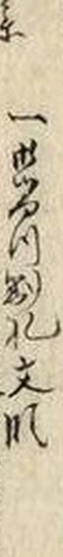一御留川制札文段
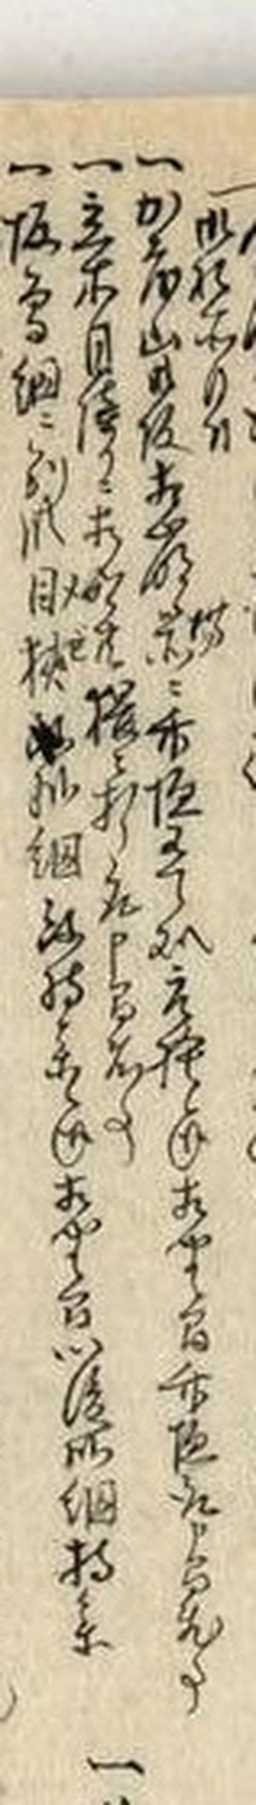一坂鳥網ニ別段目狭掛網致持参候趣相聞候間以後掛網持参
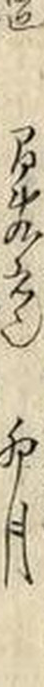間敷者也卯月
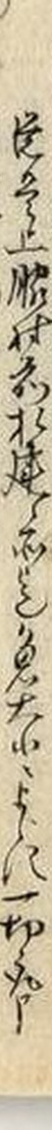従是上脇村前札建候所迄魚大小ニよらす一切取申
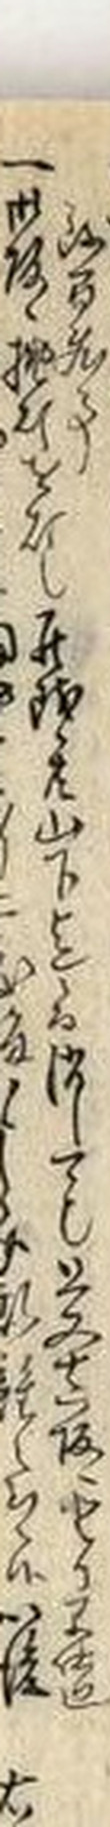一御坂へ提灯を灯し罷越候共山下迄ニ而消し可申候且又真坂へ登り早仕廻
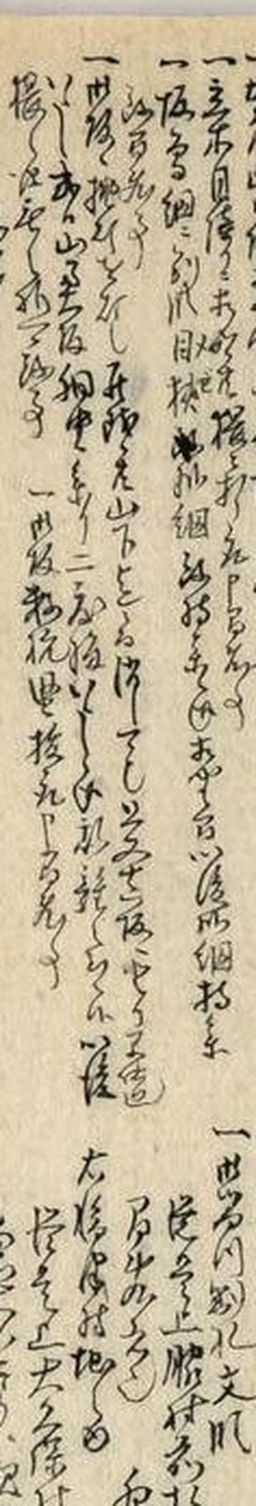一御坂へ提灯を灯し罷越候共山下迄ニ而消し可申候且又真坂へ登り早仕廻
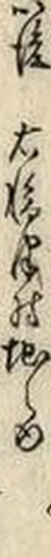右稲津浦地之内
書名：御国他国諸事之部
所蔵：福井県文書館 Fukui Prefectural Archives
